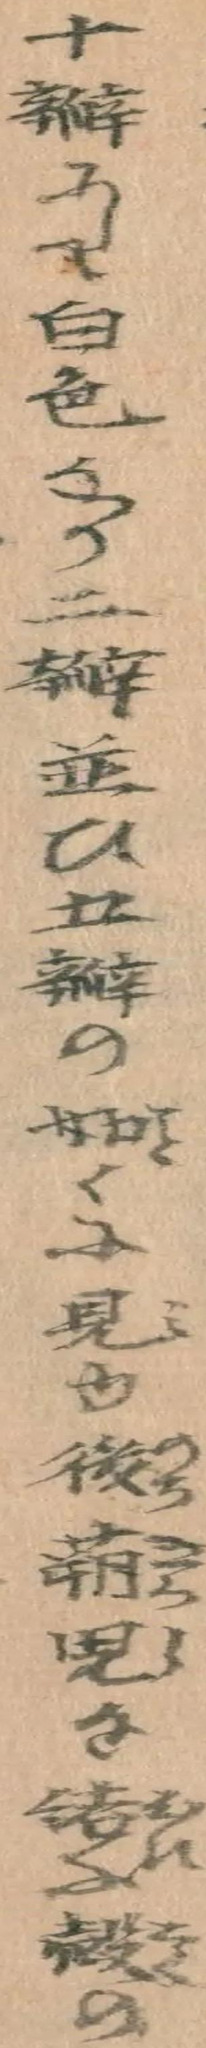十弁にして白色なり二弁並ひ五弁の如くに見ゆ後蒴児を結ふ殻の
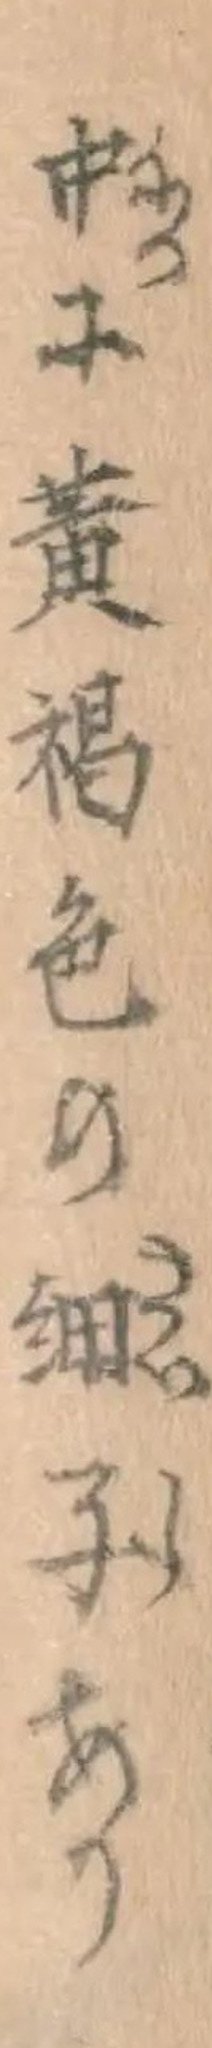中に黄褐色の細子あり
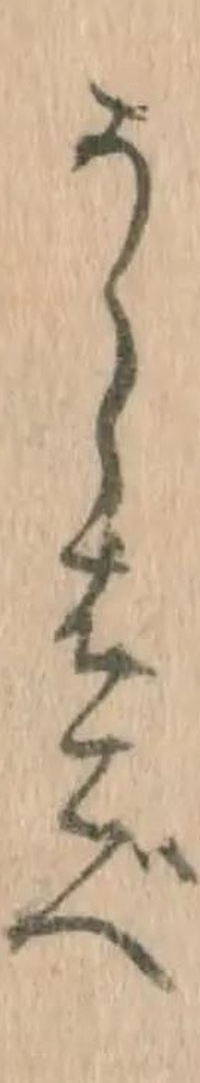うしはこべ
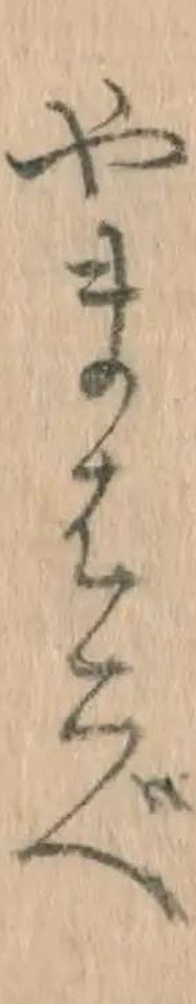やまはこべ
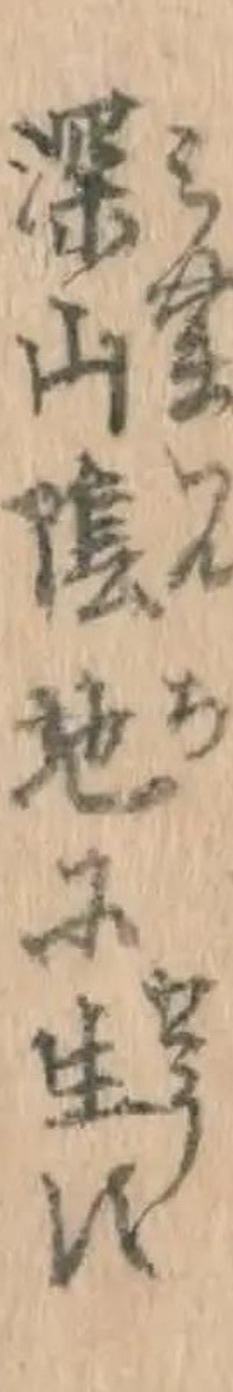深山陰地に生す
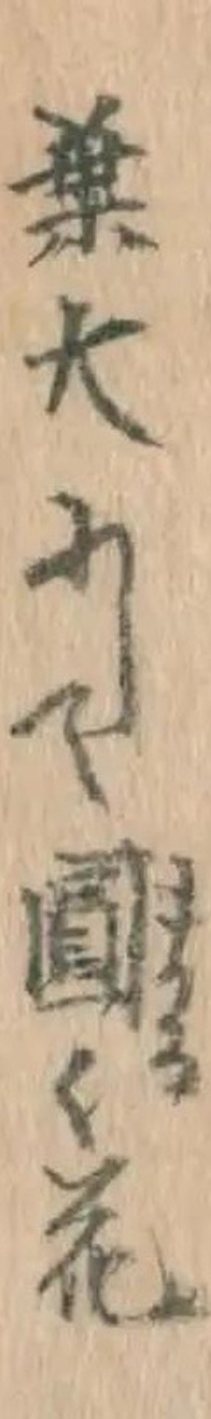葉大にして円く花
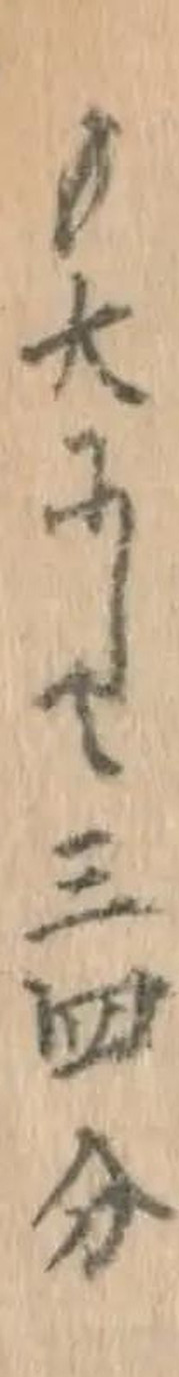も大にして三四分

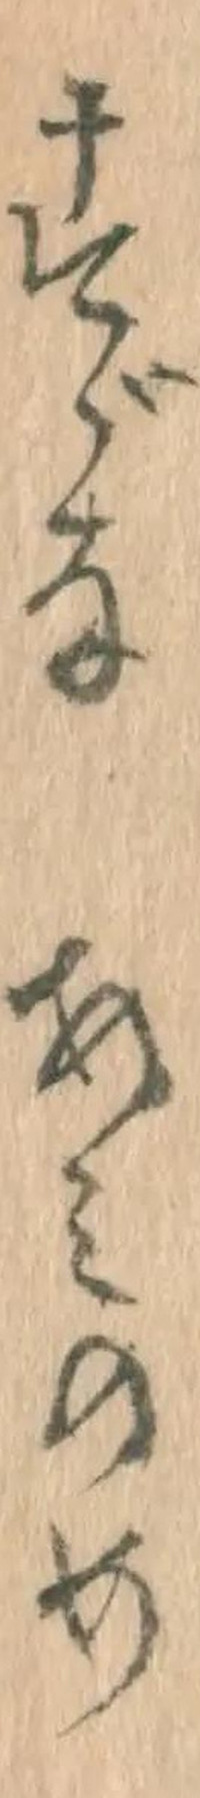すゞなあみのめ
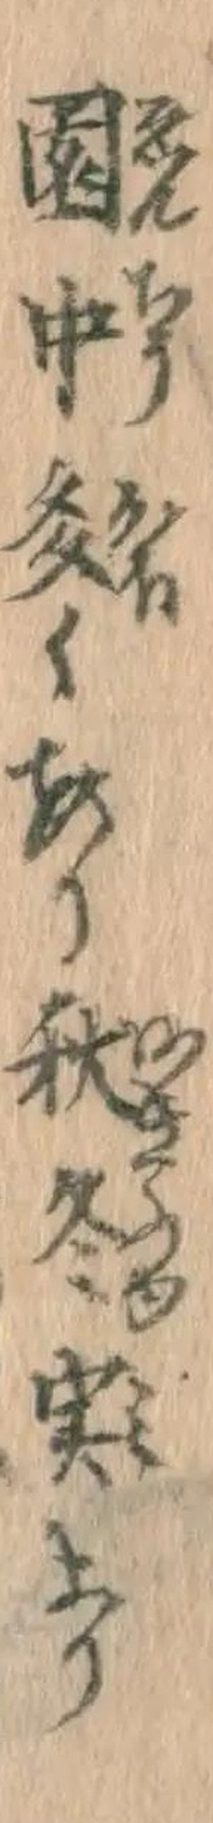園中多くあり秋冬実より
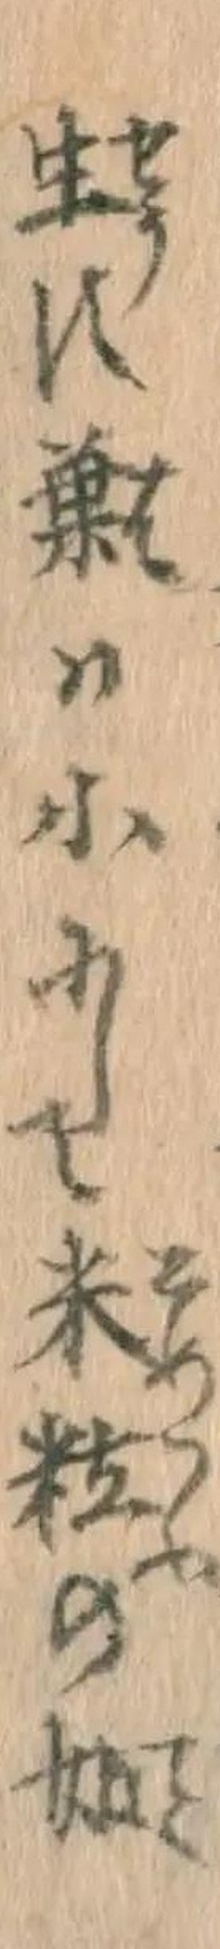生す葉は小にして米粒の如
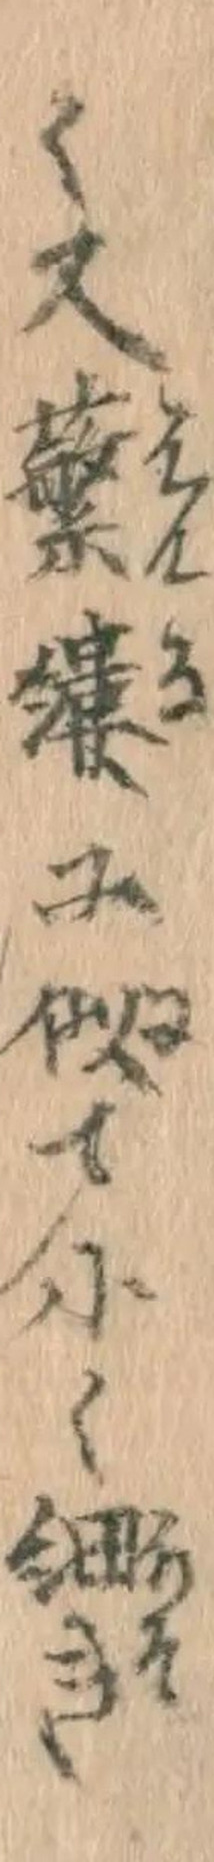く又蘩縷に似て小く細き
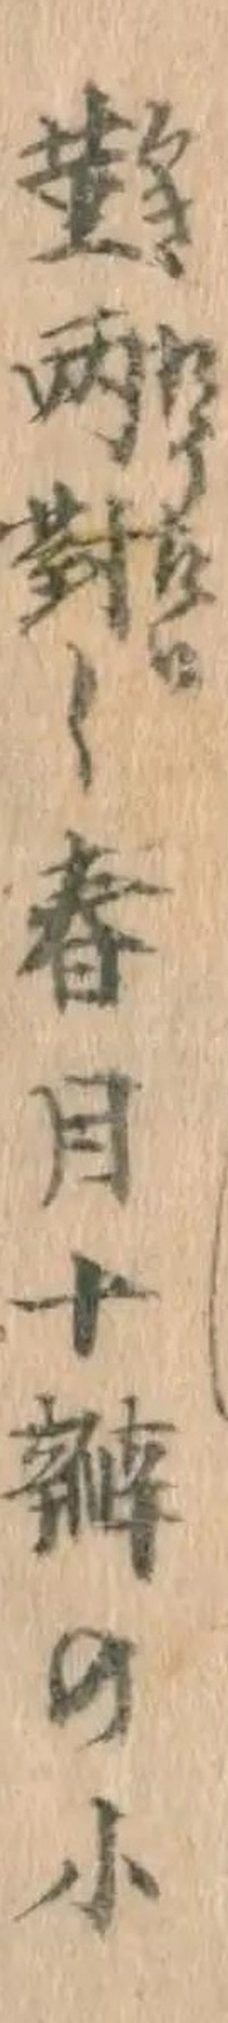茎両対し春月十弁の小
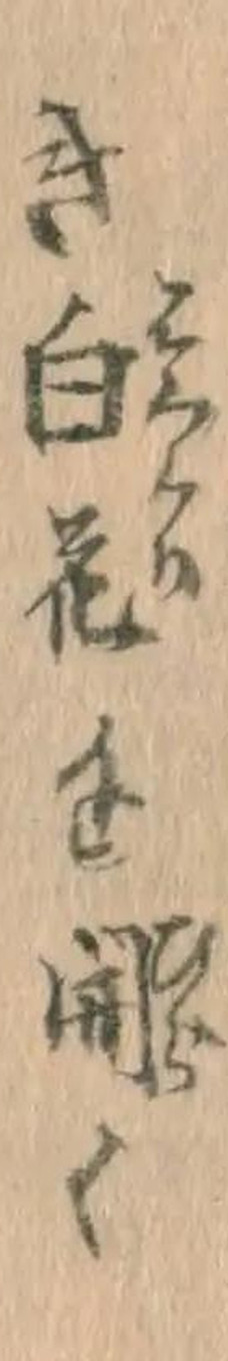き白花を開く
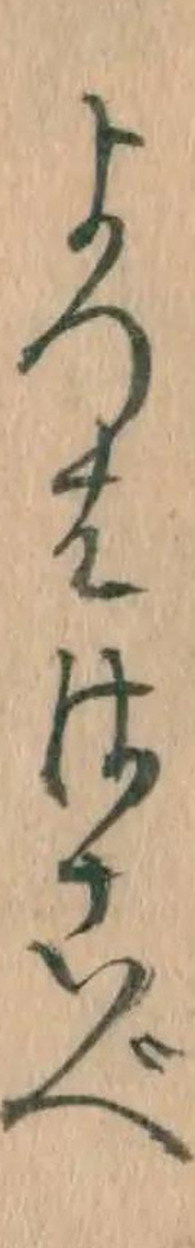よつははこべ
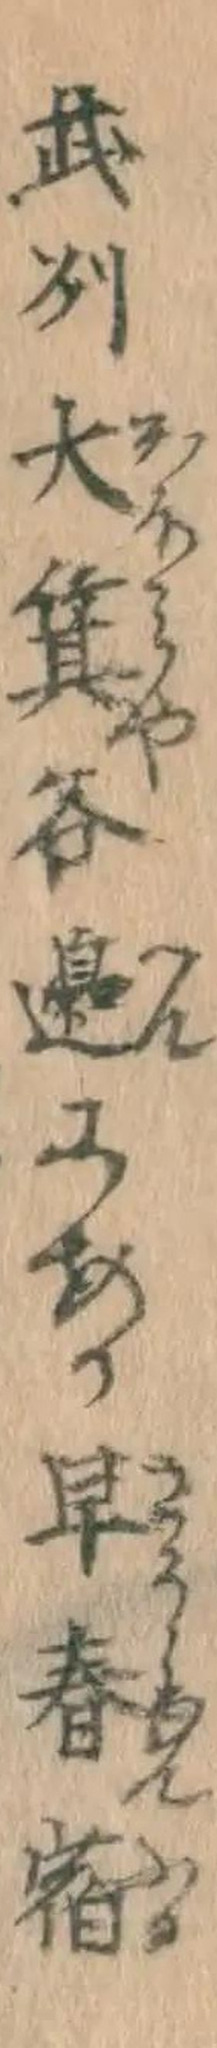武州大箕谷辺にあり早春宿
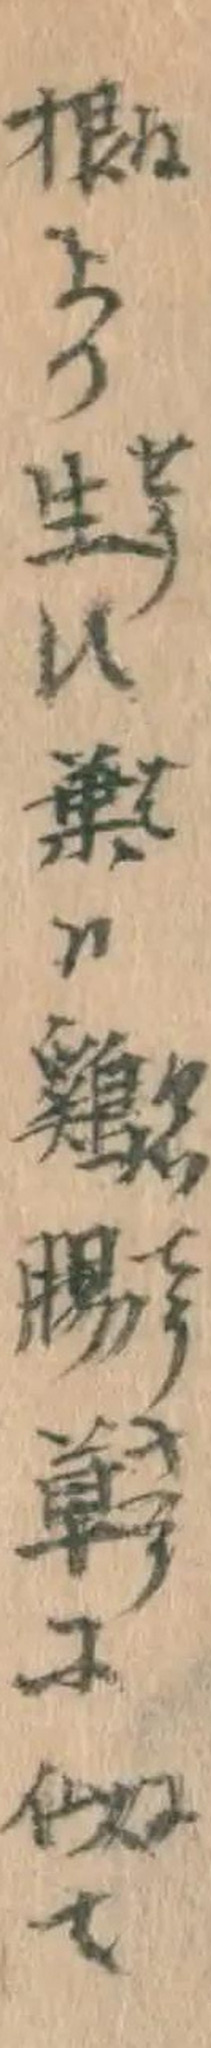根より生す葉は鶏腸草に似て
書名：本草図譜. 巻46-48
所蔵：国立国会図書館 National Diet Library, JAPAN
